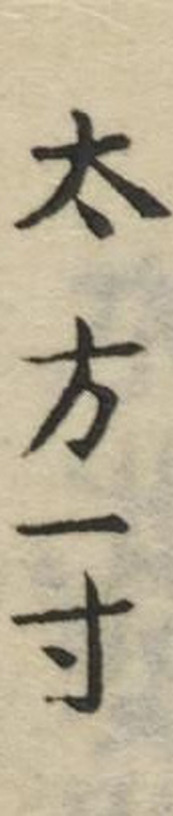太方一寸
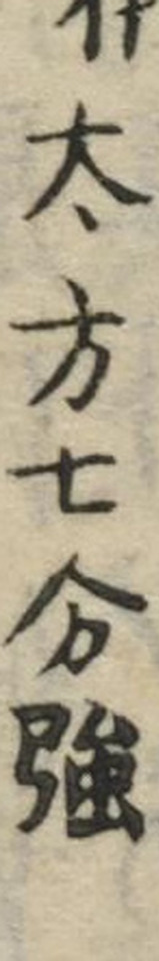太方四分強
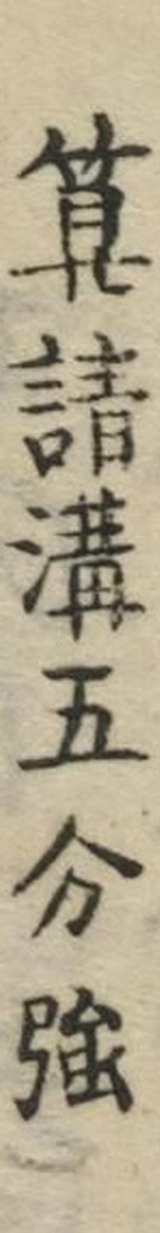算請溝五分強
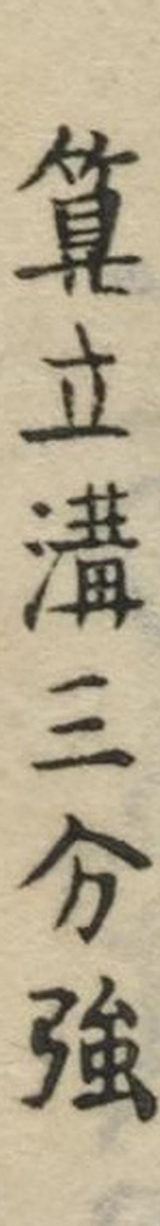算立溝三分強
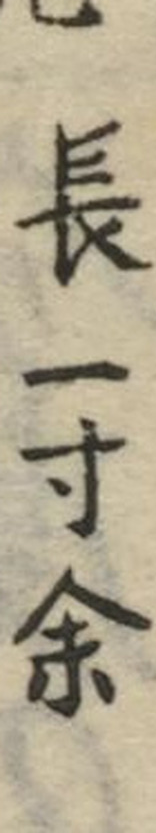長一寸余
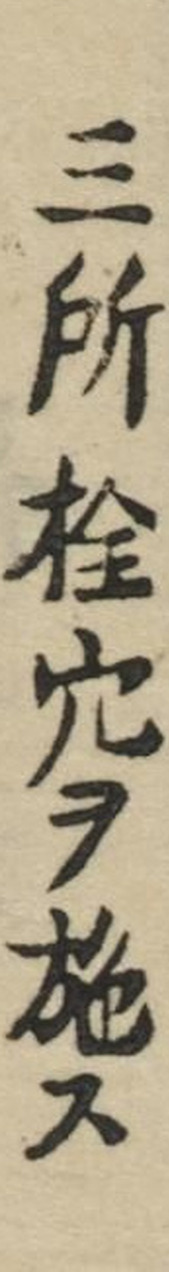三所栓穴ヲ施ス
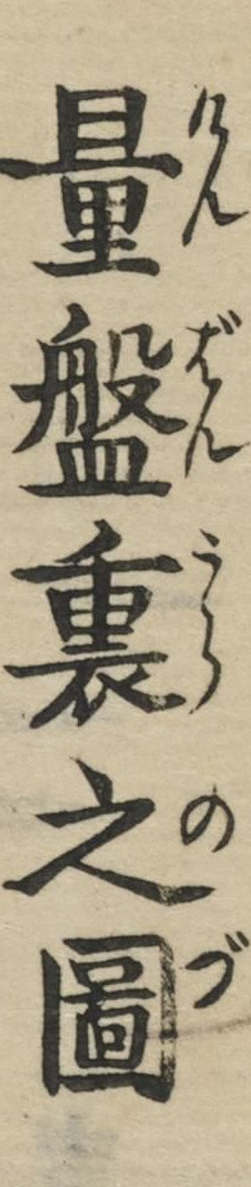量盤裏之図
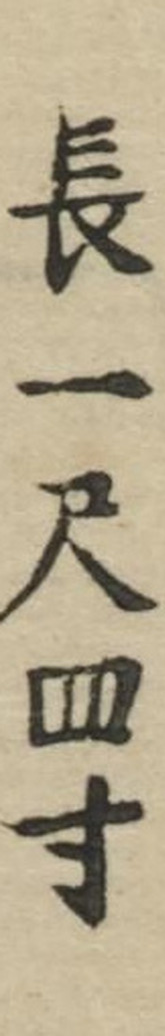長一尺四寸
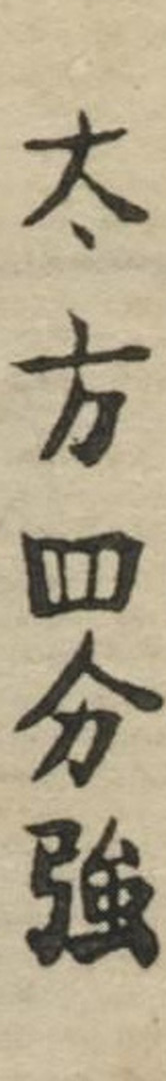太方四分強
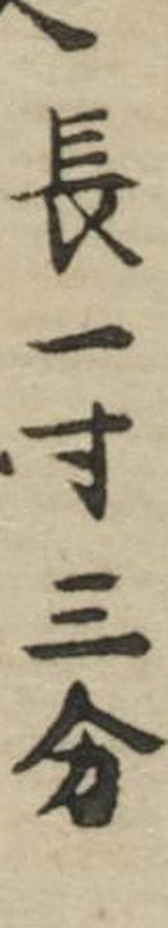長七寸五分
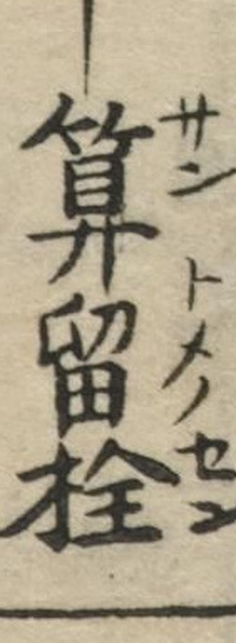算留栓
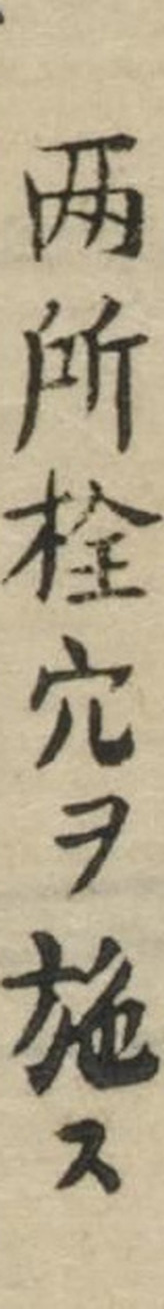両所栓穴ヲ施ス
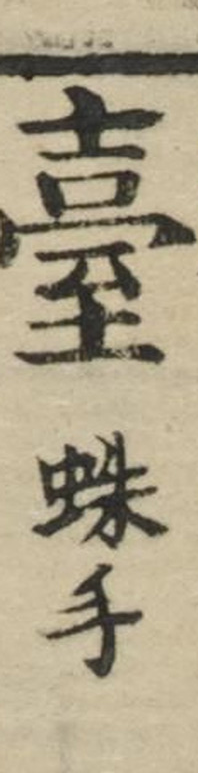台蛛手
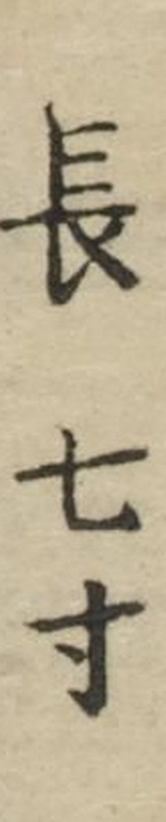長七寸
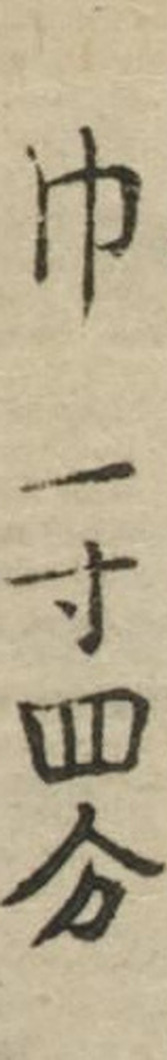巾一寸四分
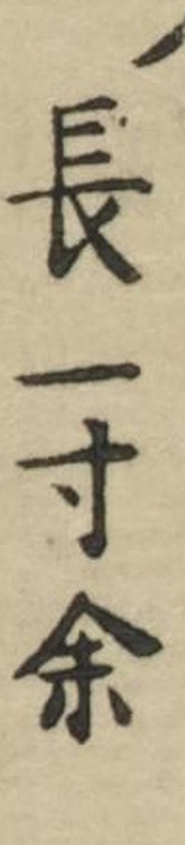長一寸余
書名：量地指南　巻之一（内題）
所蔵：東京大学地震研究所図書室 Earthquake Research Institute Library, The University of Tokyo, JAPAN
